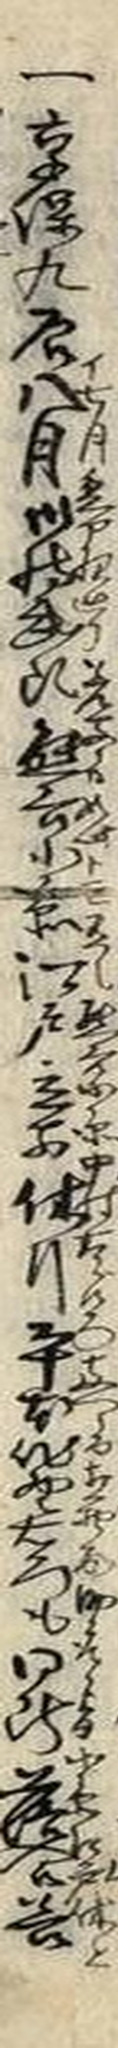一享保九辰八月御持武頭熊谷小兵衛江戸立前休引平本作野右衛門も同断落合善
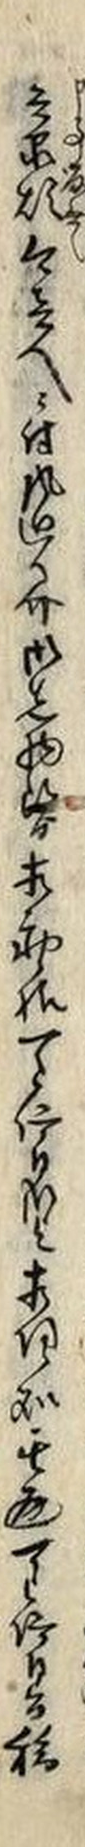兵衛煩今壱人に付風廻り介御先物頭ゟ相勤候様可被仰付哉と相伺候処其通可被仰付旨稲
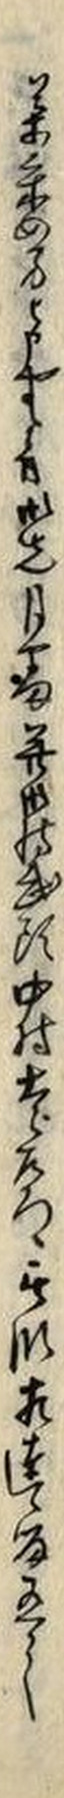葉采女方被申聞候に付御先月番并御持武頭中村太郎左衛門へ其段相達候留有之

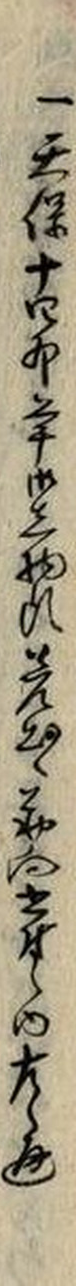一天保十四卯年御先物頭差出候勤向書付之内左之通
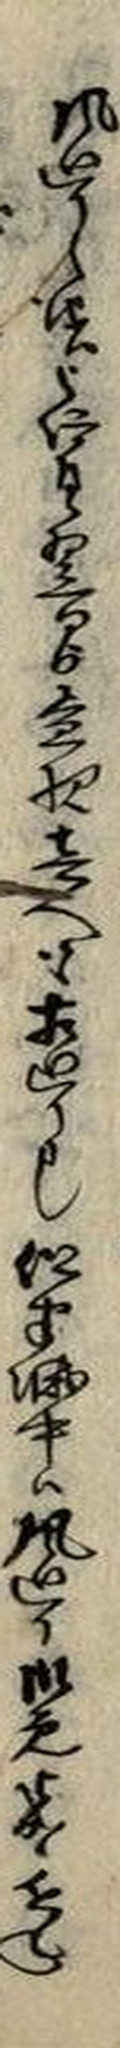風廻り之儀は被仰付候翌日ゟ昼夜壱人ツヽ相廻り申候但半減中は風廻り御免被成候近年
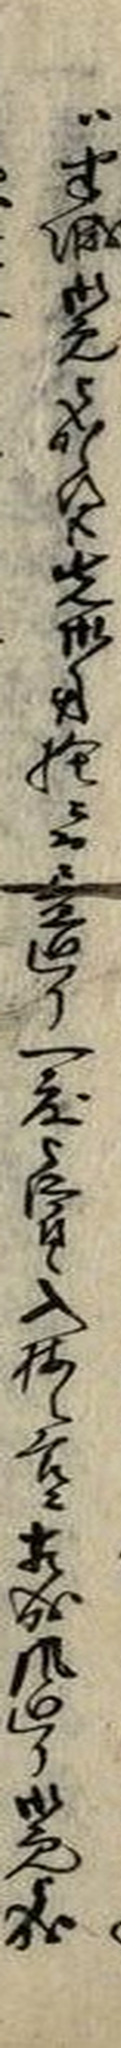は半減御免被成候得共先御用捨にて昼廻り一度被仰付候入梅之節に相成風廻り御免被成
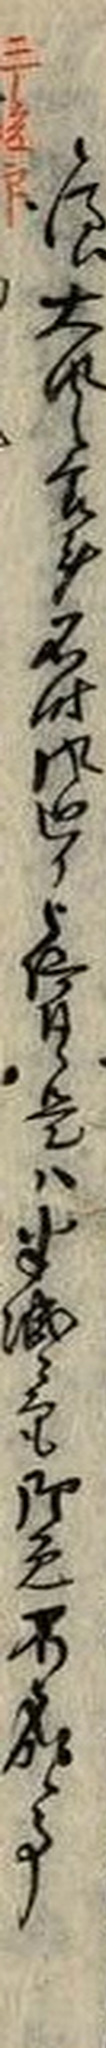候得は大風之節斗不時風廻り被仰付候是は半減にても御免不被成候事
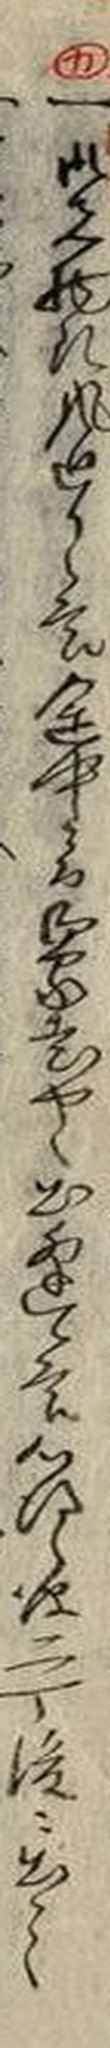一御先物頭風廻り之節途中にて御家老中へ出逢候節心得之儀二丁後に出之
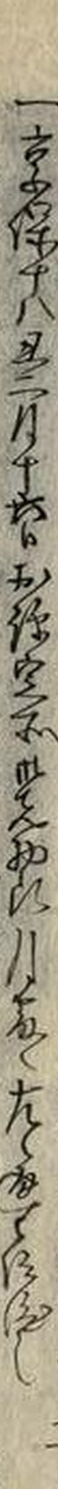一享保十八丑二月十六日於評定所御先物頭月番へ左之通被仰渡候
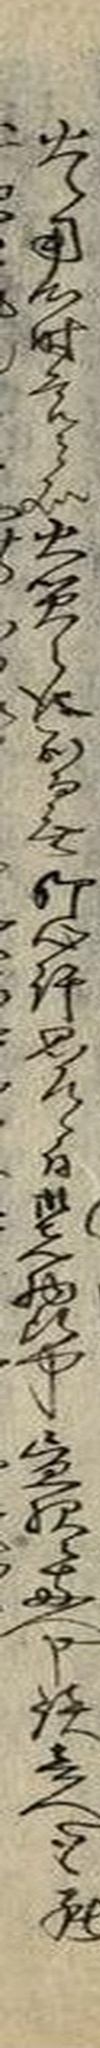火の用心時節之処火災之儀別て無御心許思召候に付御先物頭中昼夜之両人申談壱人ツヽ罷
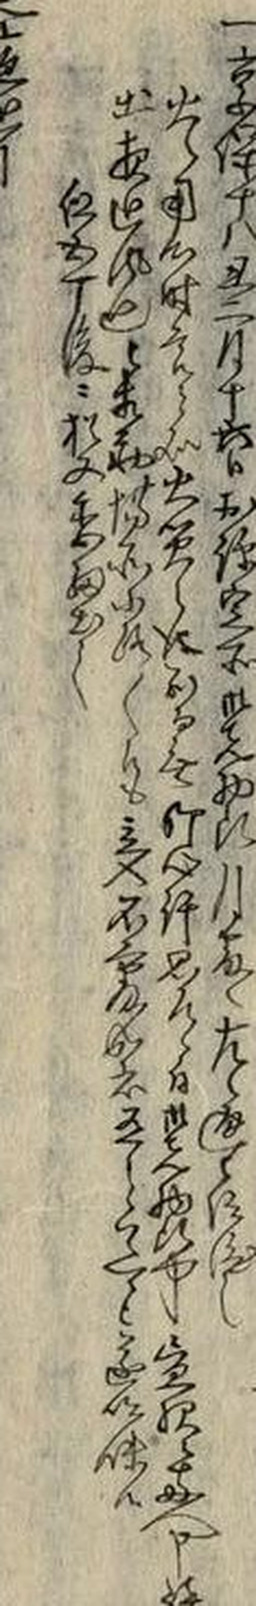出夜廻風廻被相勤場所小路〳〵えも立入不審成者有之候はゝ可被遂吟味候
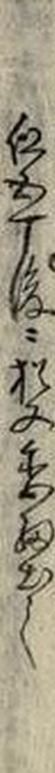但五丁後に猶又委細出之
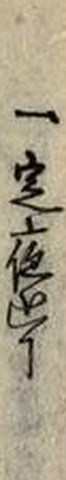一定夜廻り
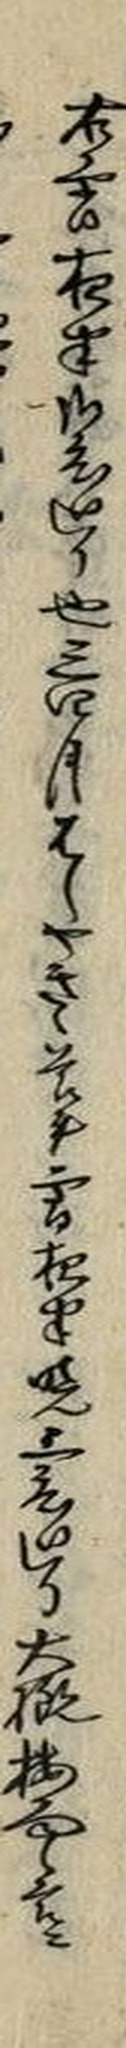右平日夜半弐度廻り也三四月はしやき候節斗宵夜半暁三度廻り大概梅雨之節に
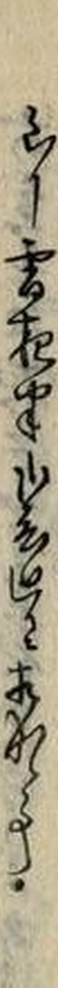至り宵夜半弐度廻りに相成候事
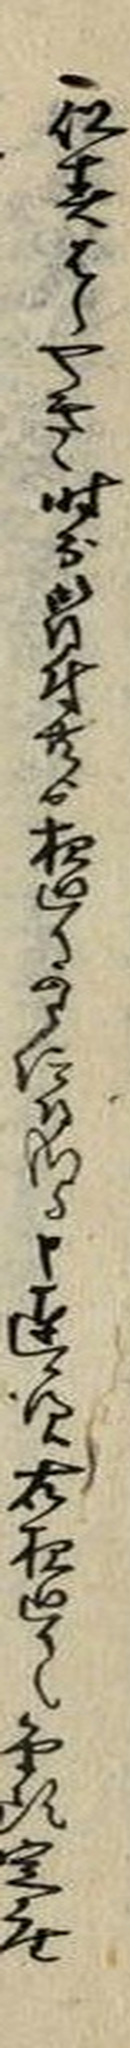・但春はしやき候時分御目付共ゟ夜廻り可被仰付哉と申達候得は右夜廻り之筆頭定座
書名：御城下諸事之部
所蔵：福井県文書館 Fukui Prefectural Archives
